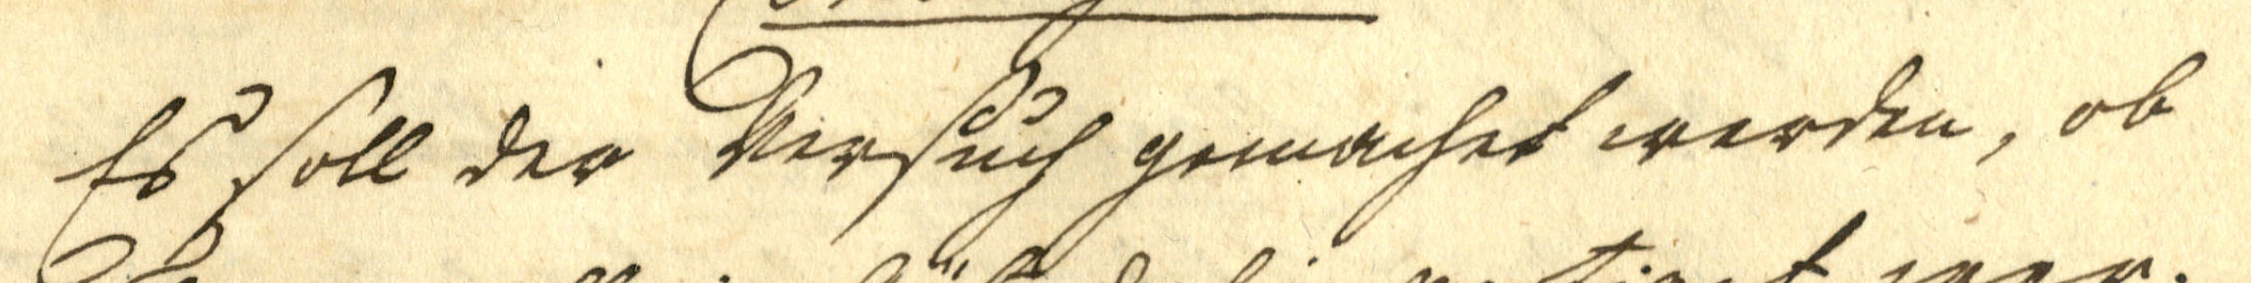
Es soll der Vorsuch gemachet werden, ob
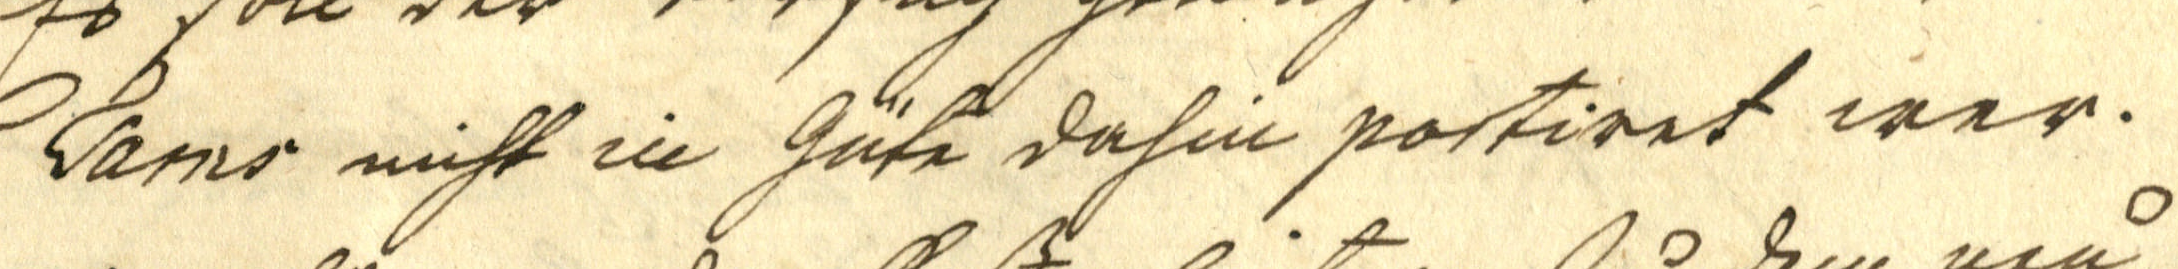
Tams nicht in Güte dahin portiret wer¬
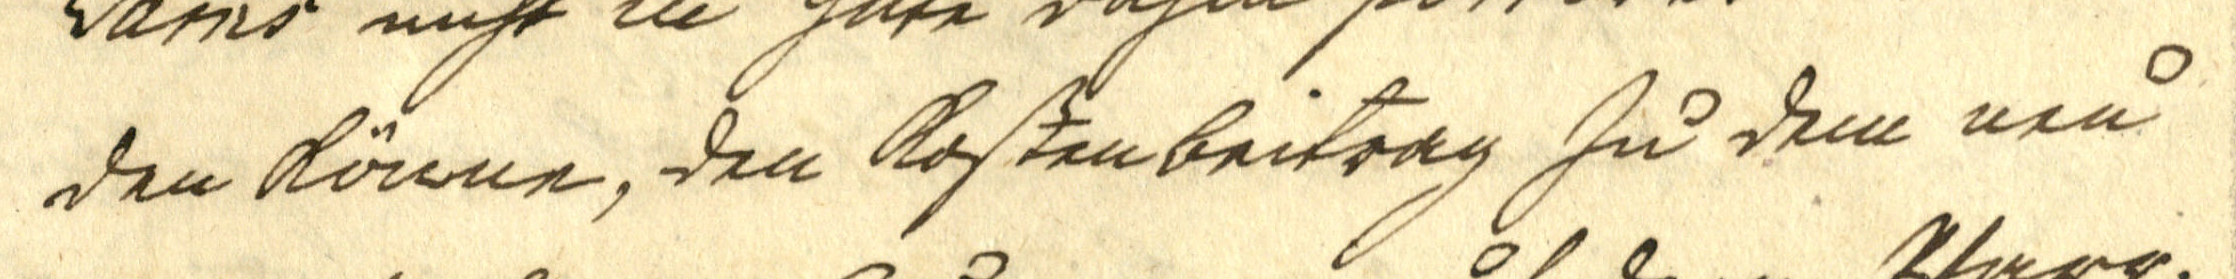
den könne, den Kostenbeitrag zu dem neu
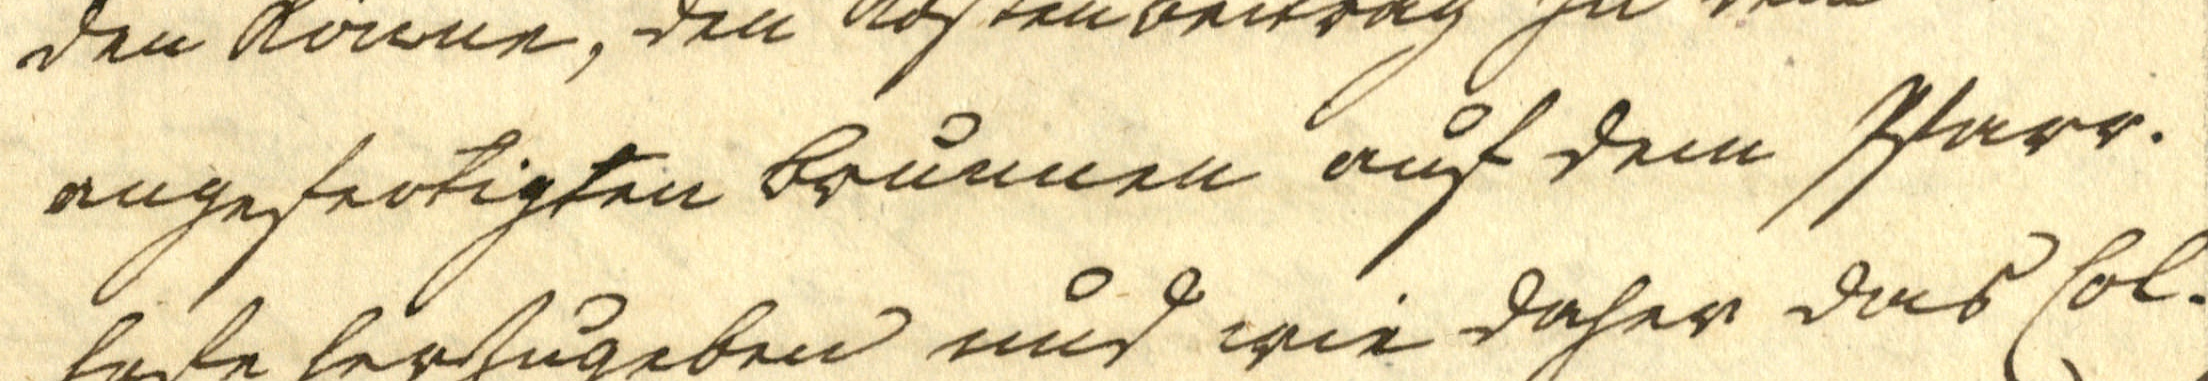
angefertigten Brunnen auf dem Pfarr¬
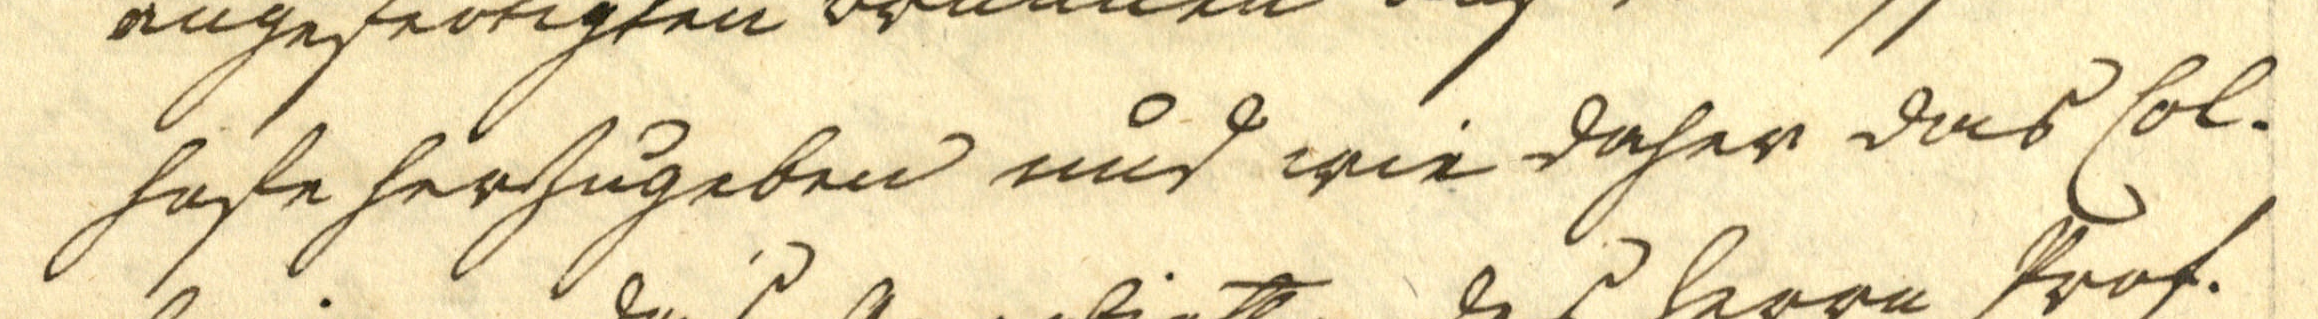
hofe herzugeben und wie daher das Col¬
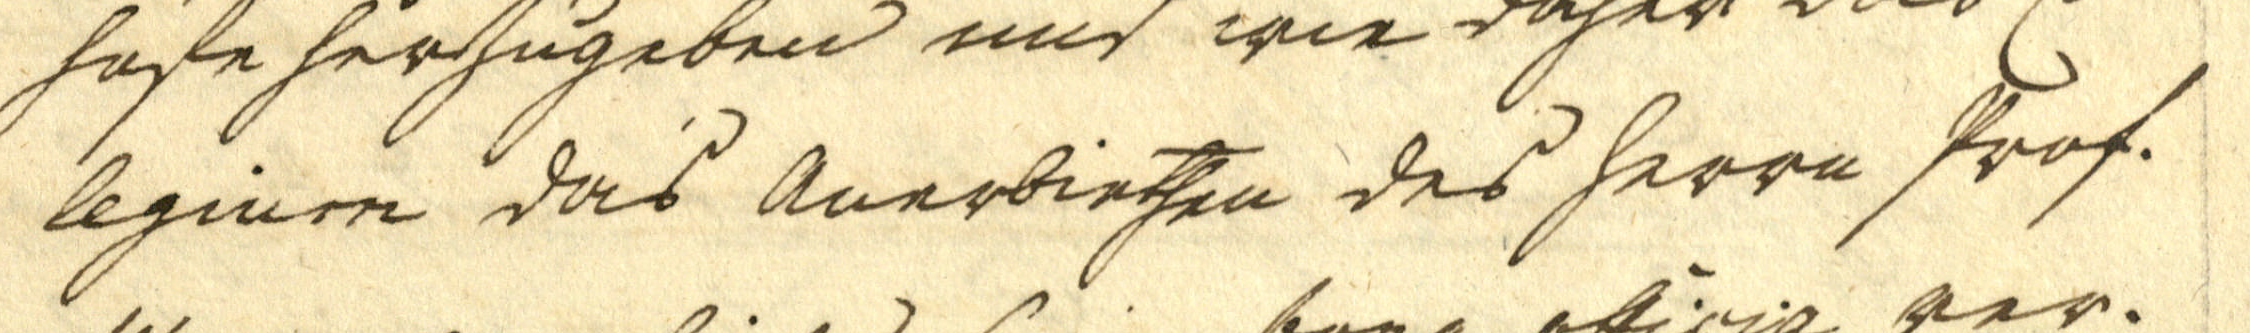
legium das Anerbiethen des Herrn Prof.
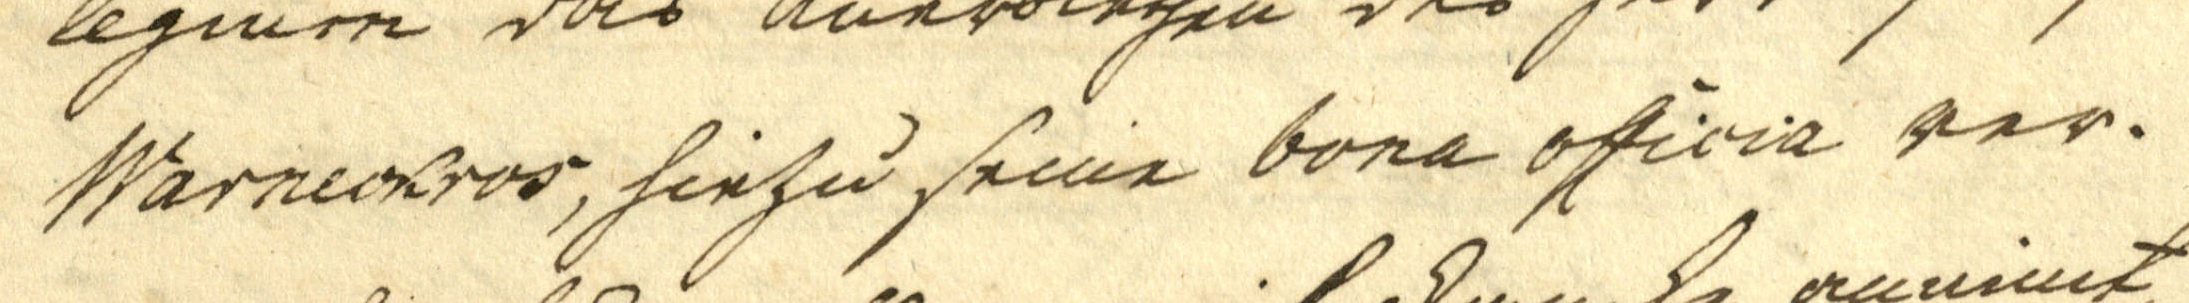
Warneckros, hiezu seine bona officia ver¬
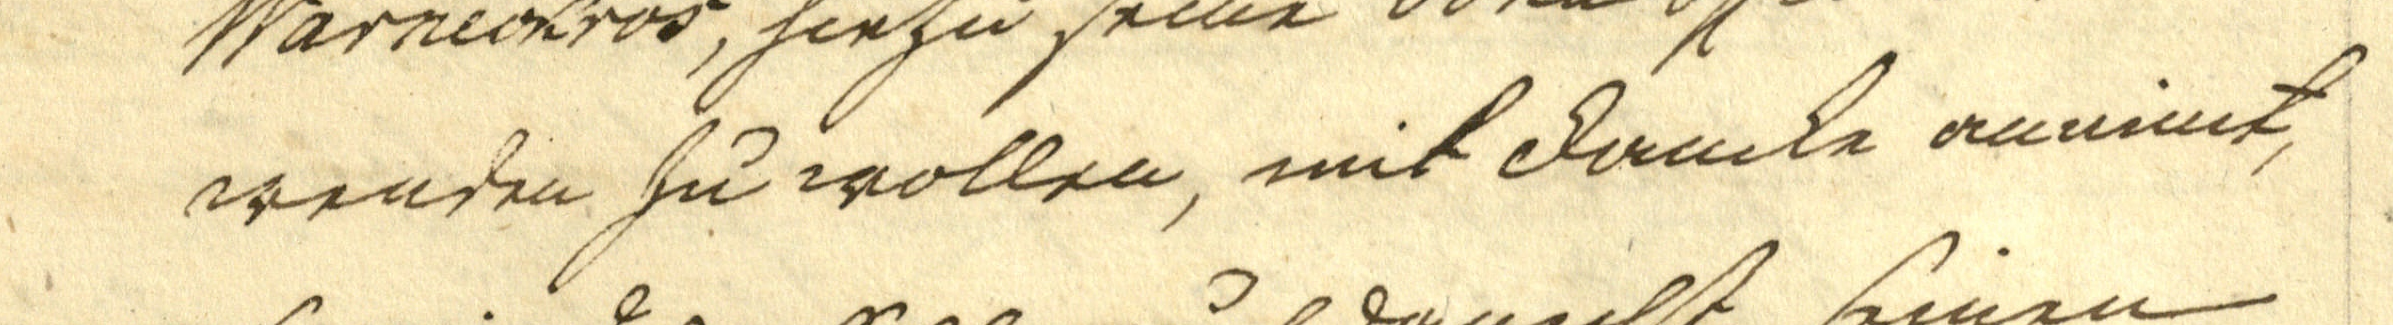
wenden zu wollen, mit Dancke annimt,
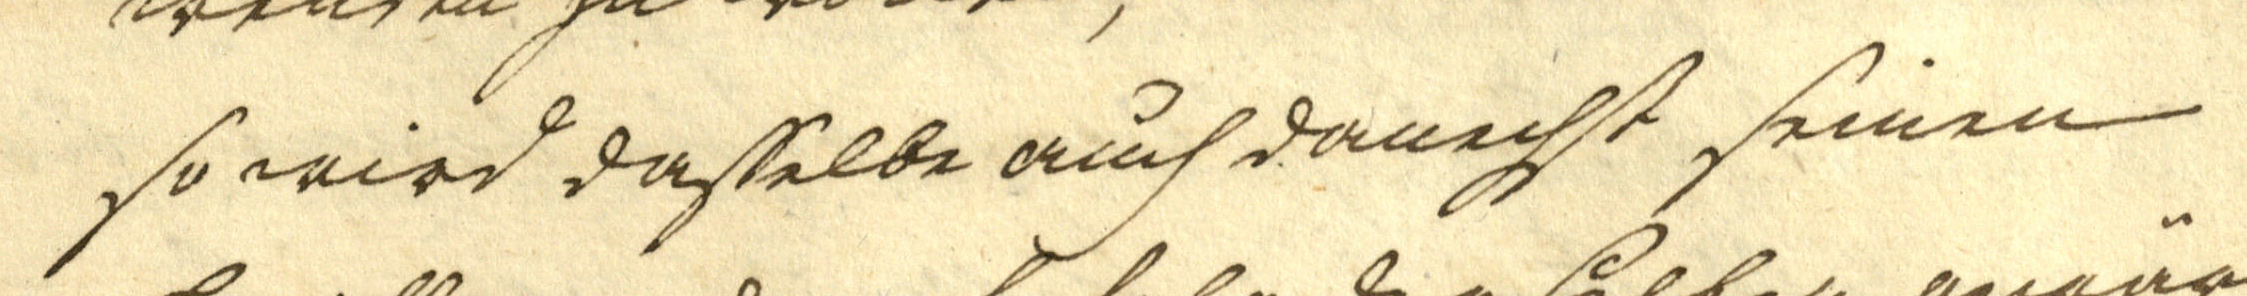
so wird dasselbe auch danechst seinen
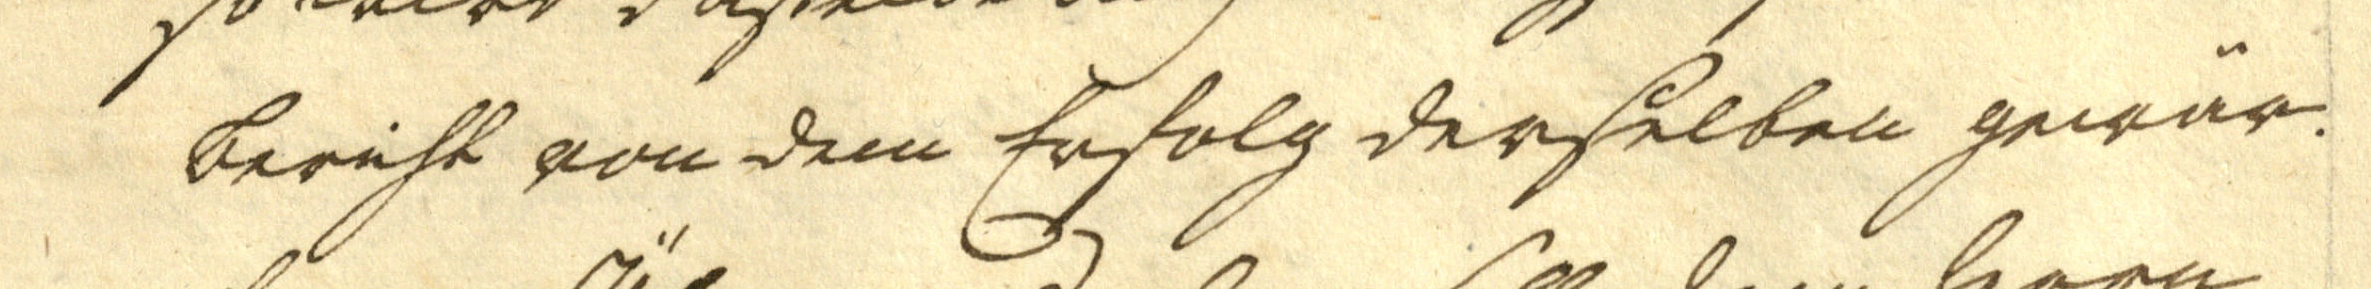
Bericht von dem Erfolg derselben gewär¬
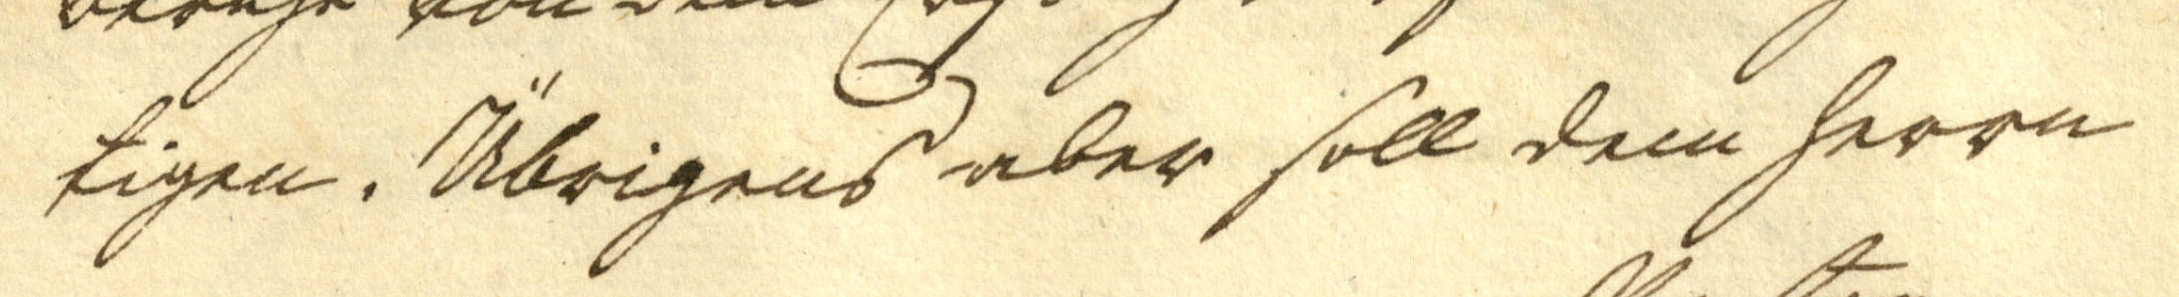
tigen. Übrigens aber soll dem Herrn
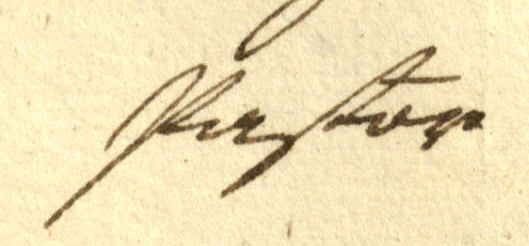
Pastor
